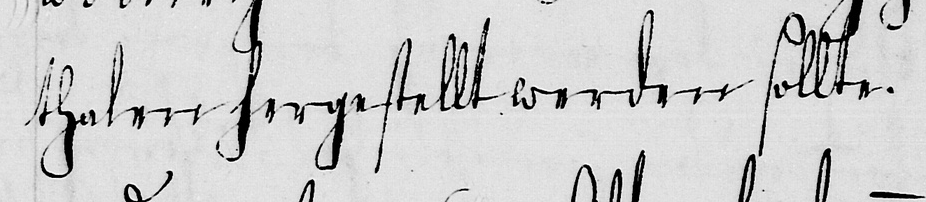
thalen hergestellt werden sollte.
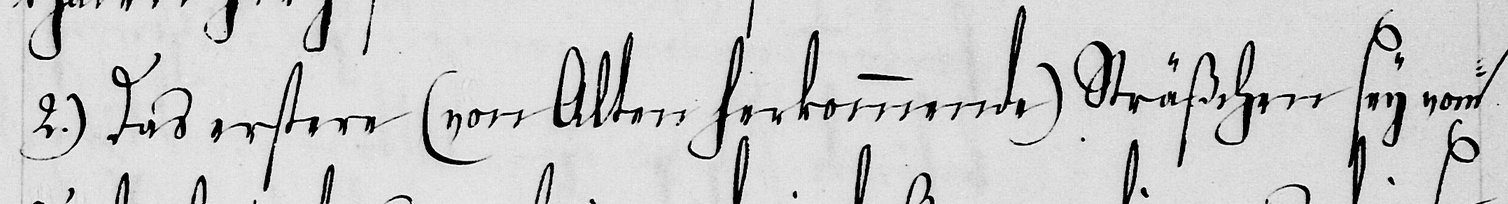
2.) Das erstere (von Alten herkommende) Sträßchen sey vom
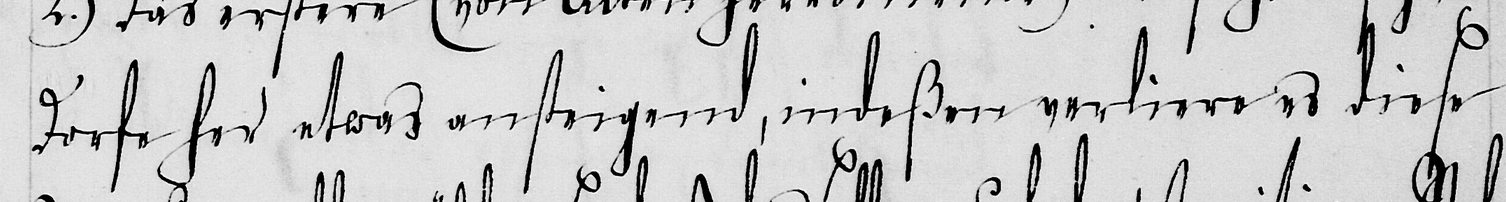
Dorfe her etwas ansteigend, indeßen verliere es diese
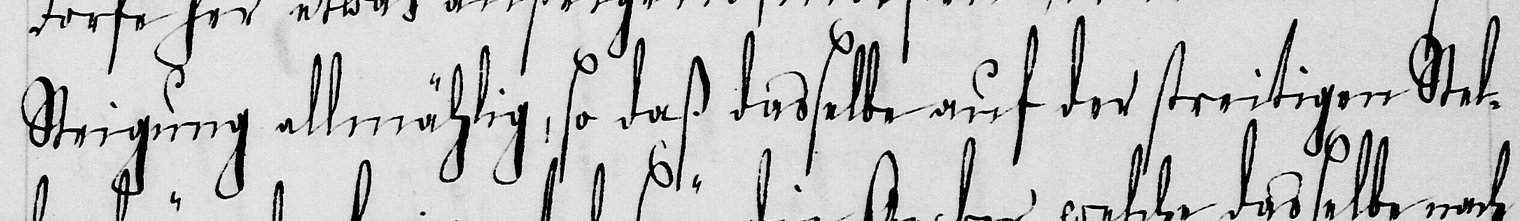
Steigung allmählig, so daß dasselbe auf der streitigen Ste¬
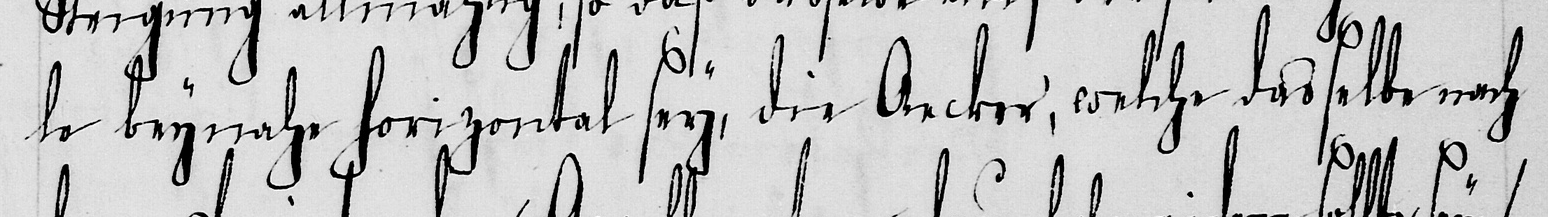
le beynahe horizontal sey, die Aecker, welche dasselbe nach
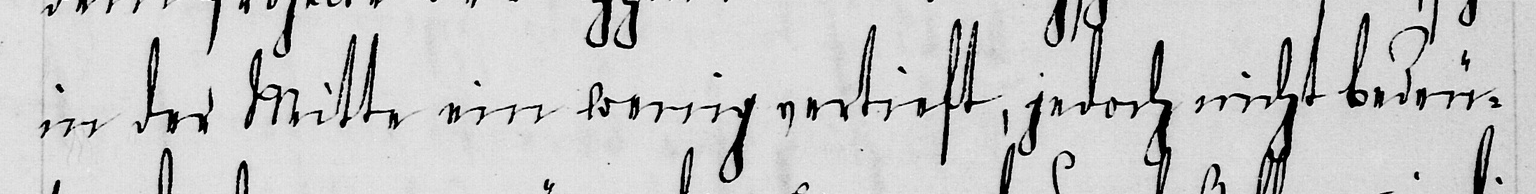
in der Mitte ein wenig vertieft, jedoch nicht bedeu¬
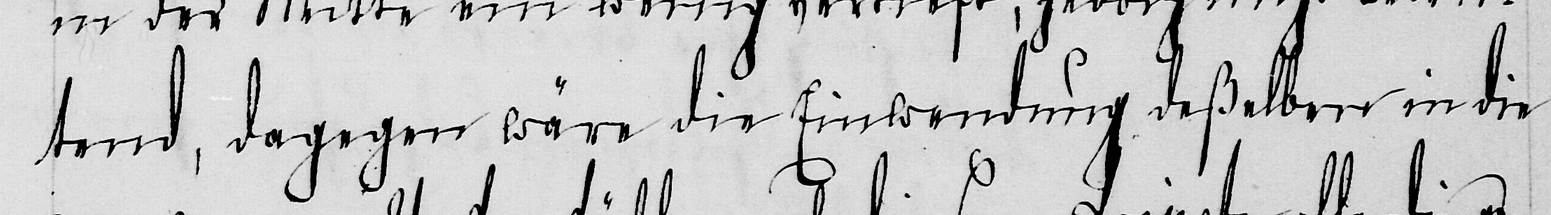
tend, dagegen wäre die Einwendung deßelben in die
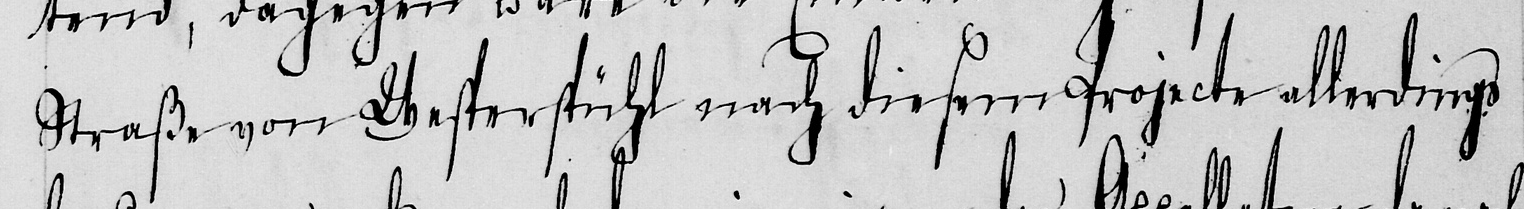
Straße von Wesperspühl nach diesem Projecte allerdings
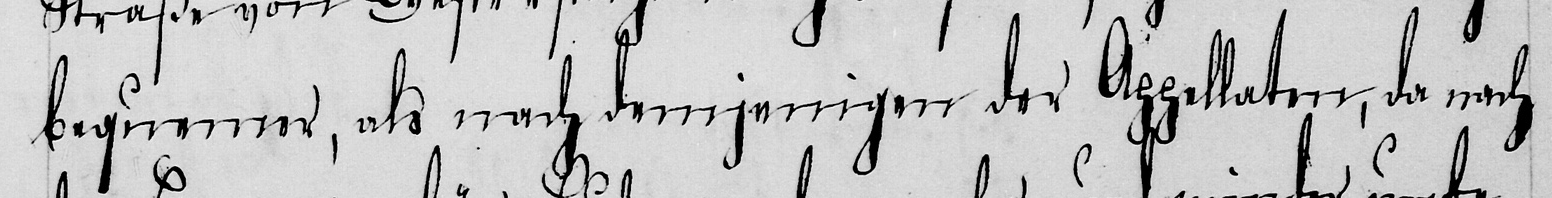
bequemer, als nach demjenigen der Appellaten, da nach
